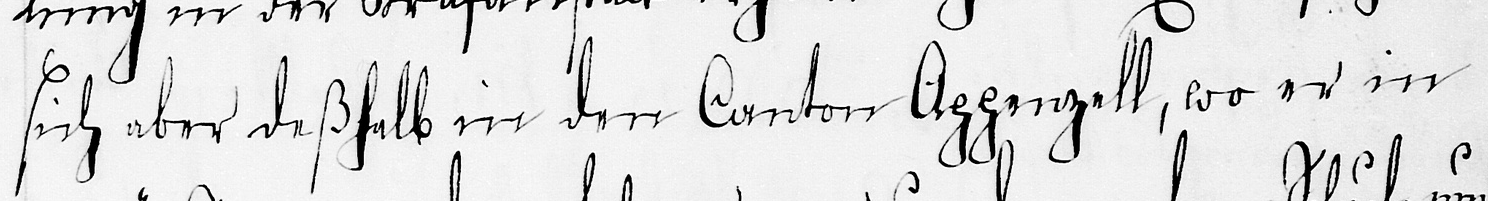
sich aber deßhalb in den Canton Appenzell, wo er in
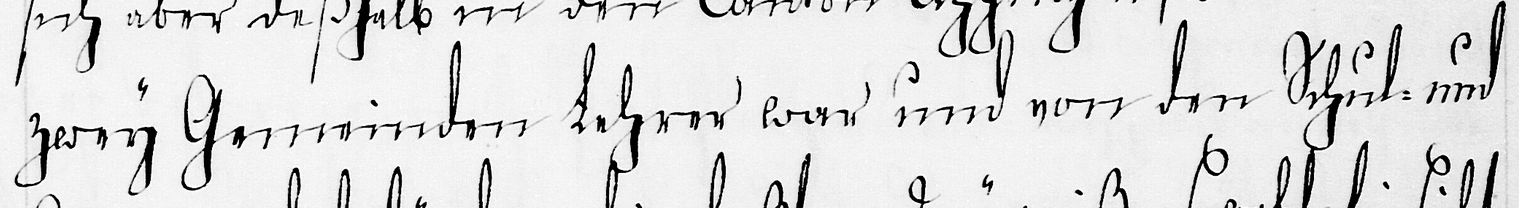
zwey Gemeinden Lehrer war und von den Schul- und
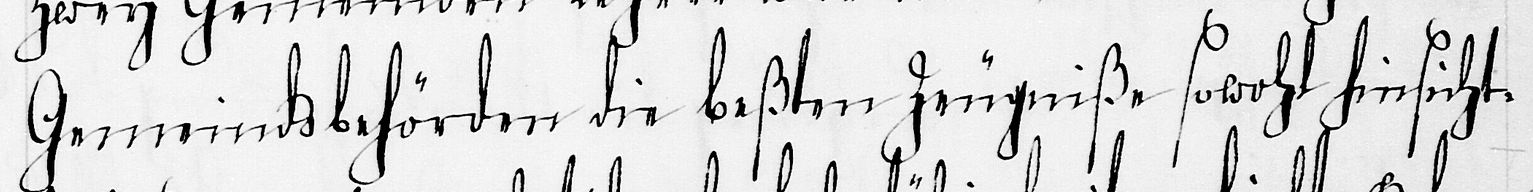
Gemeindsbehörden die beßten Zeugniße sowohl hinsicht¬
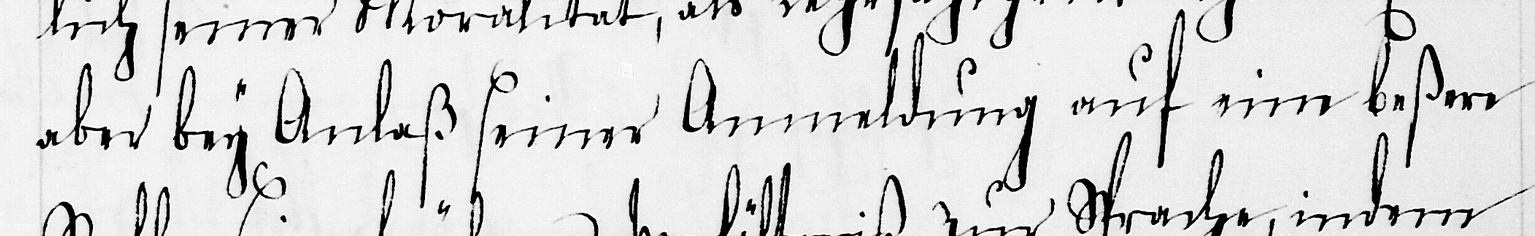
aber bey Anlaß seiner Anmeldung auf eine beßere
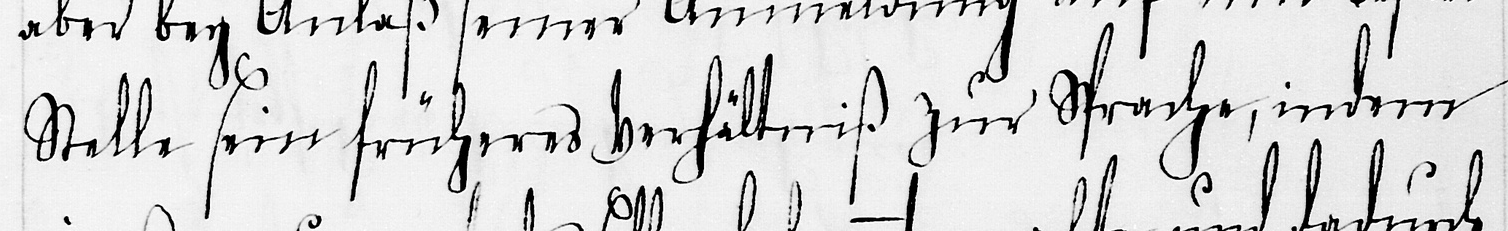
Stelle sein früheres Verhältniß zur Sprache, indem
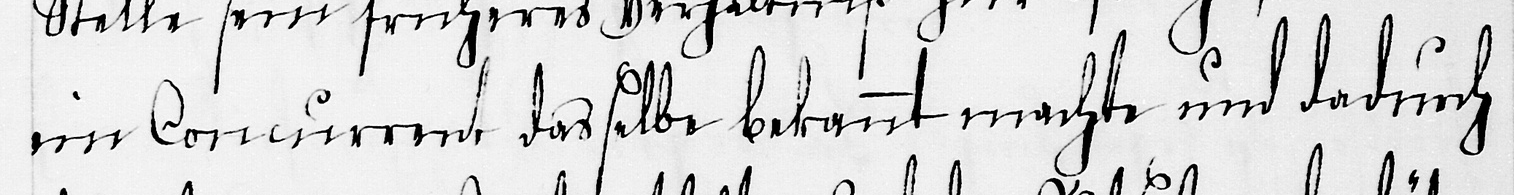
ein Concurrent dasselbe bekannt machte und dadurch
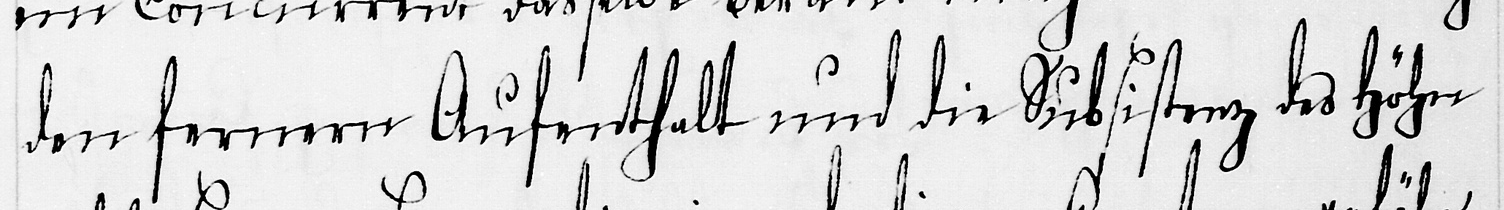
den fernern Aufenthalt und die Subsistenz des Höhn
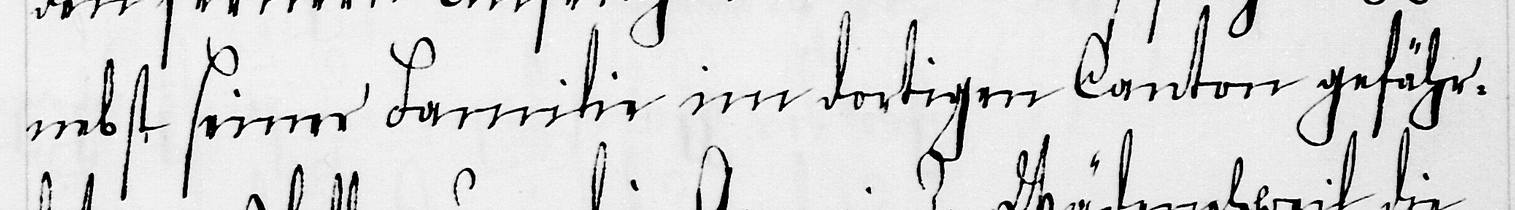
nebst seiner Familie im dortigen Canton gefähr¬
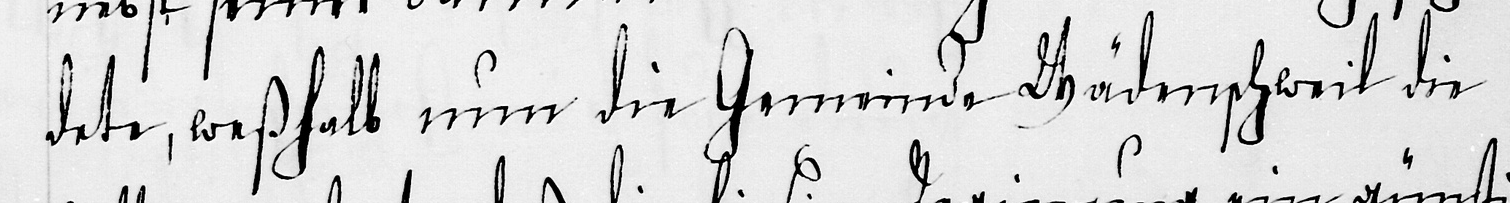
dete, weßhalb nun die Gemeinde Wädenschweil die
